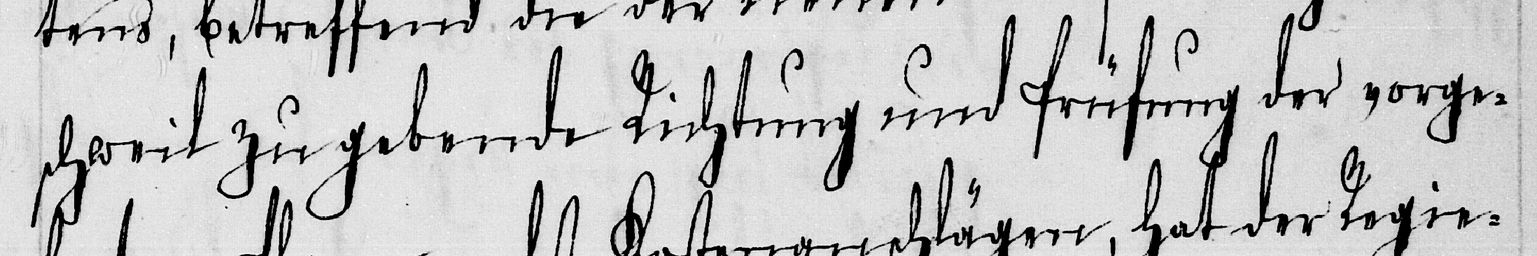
schweil zu gebende Richtung und Prüfung der vorge¬
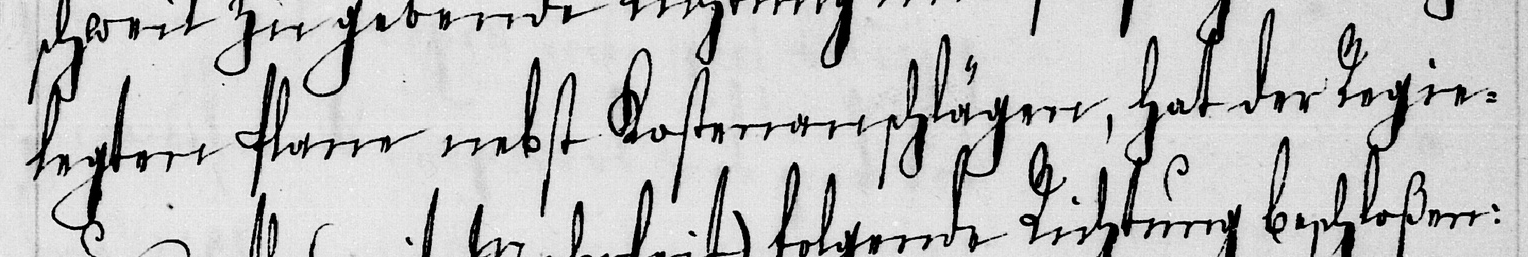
legten Plane nebst Kostenanschlägen, hat der Regie¬
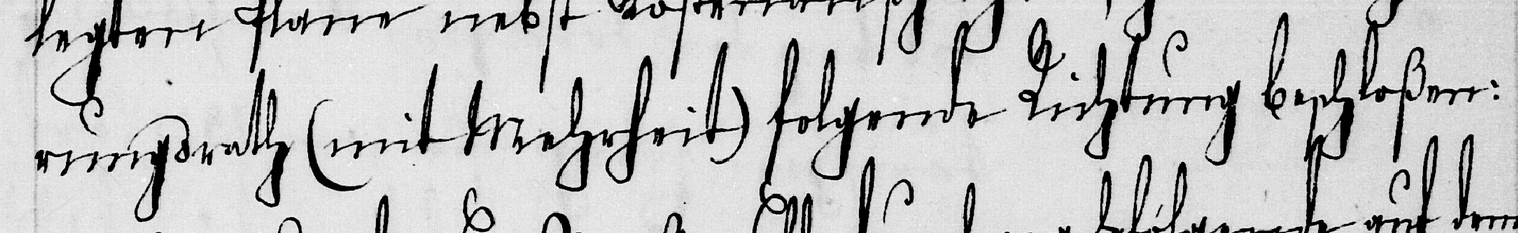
rungsrath (mit Mehrheit) folgende Richtung beschloßen:
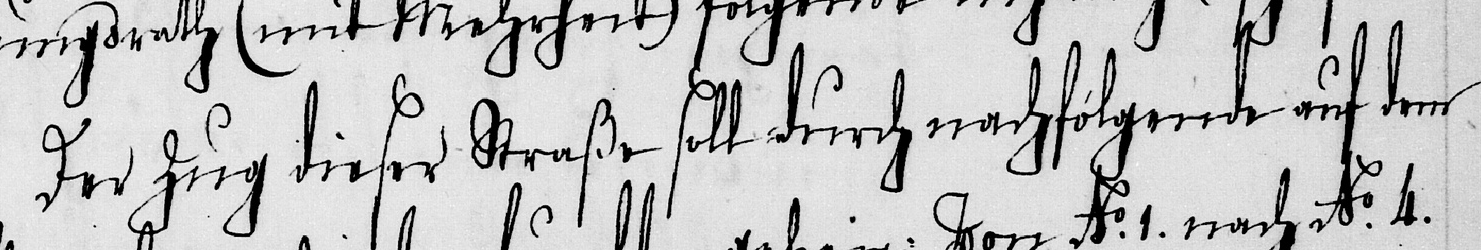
Der Zug dieser Straße soll durch nachfolgende auf dem
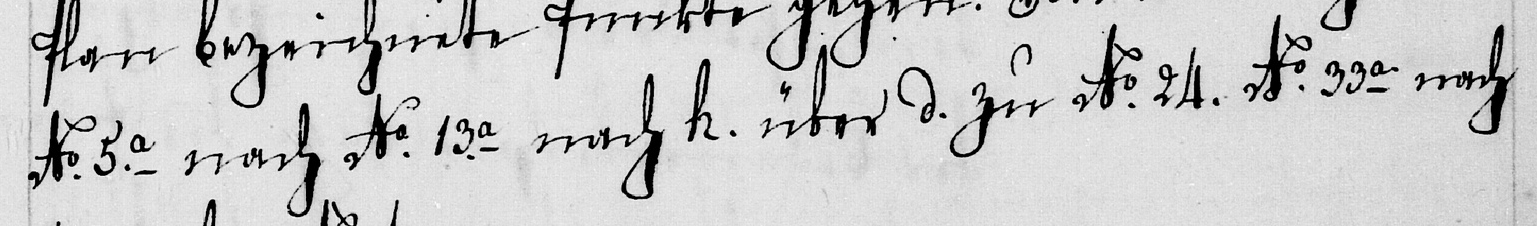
No. 5.a nach No. 13.a nach h. über d. zu No. 24. No. 33a. nach
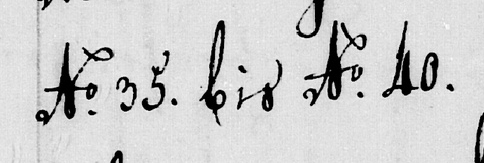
No. 35. bis No. 40.
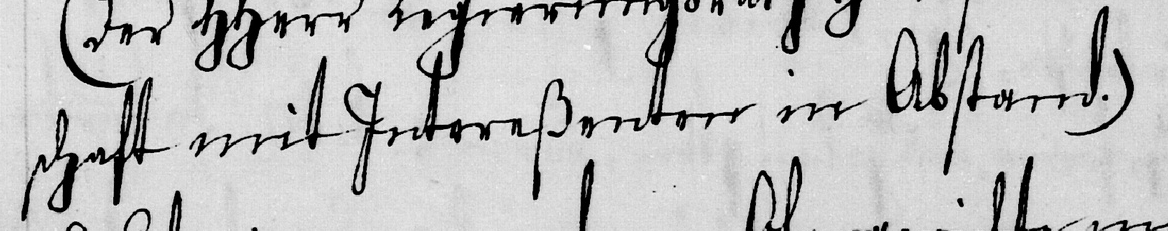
schaft mit Intereßenten in Abstand.)
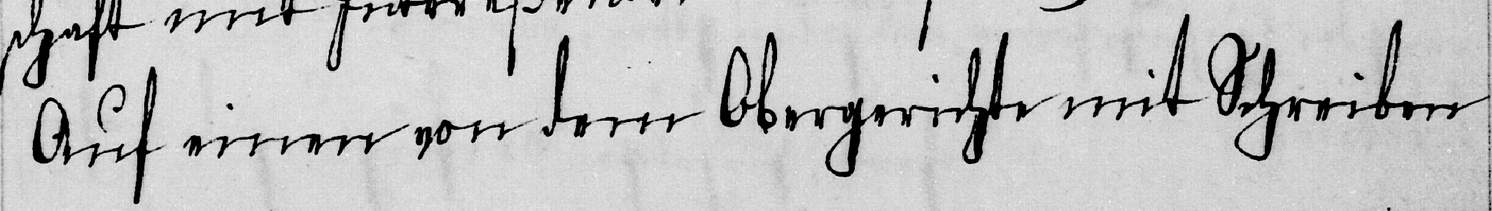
Auf einen von dem Obergerichte mit Schreiben
